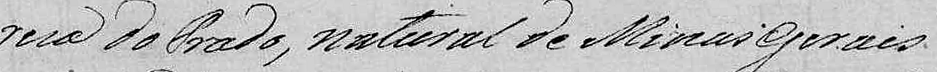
resa do Prado, natural de Minas Gerais
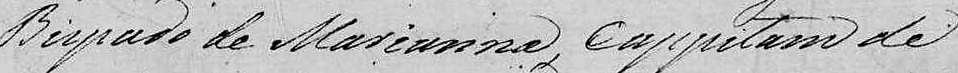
Bispado de Marianna, Cappitam de
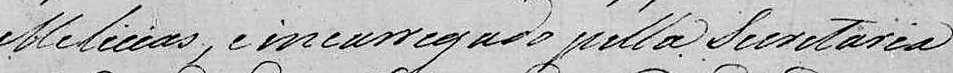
Melicias, e incarregado pella Secretaria
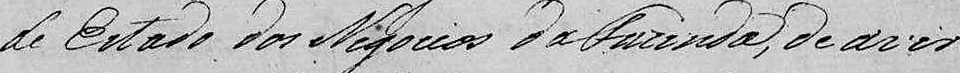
de Estado dos Negocios da Fazenda, de aver
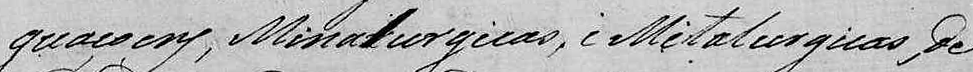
guaçoens, Minalurgicas, e Mitalurgicas, de
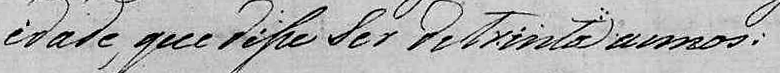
idade, que disse ser de trinta annos.
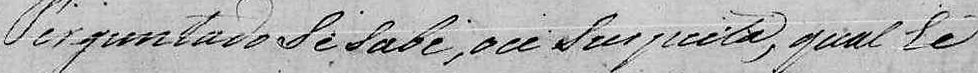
Perguntado se sabe, ou suspeita, qual he
